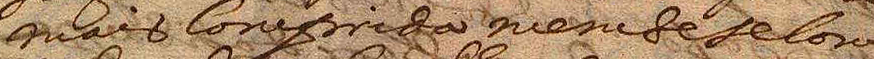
mais Compridamemte se Con
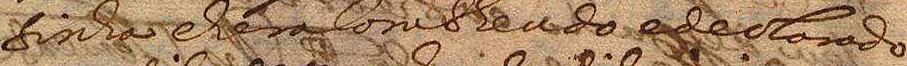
tinha e hera Comtheudo e declarado
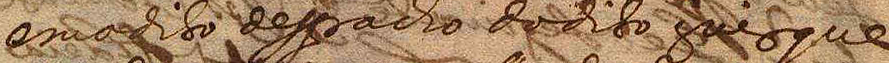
em o dito despacho do dito juis que
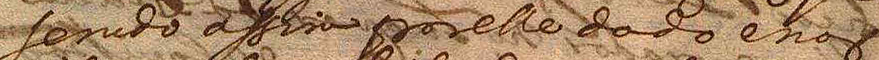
semdo assim por elle dado e nos
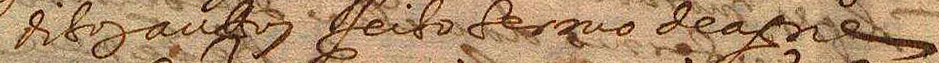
ditos auttos feito termo de apre
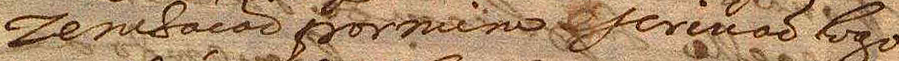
zemtaçaõ por mim escriuaõ logo
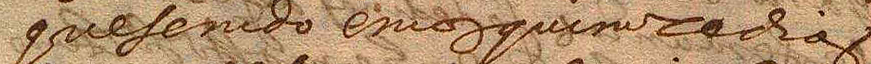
que semdo em os quimze dias
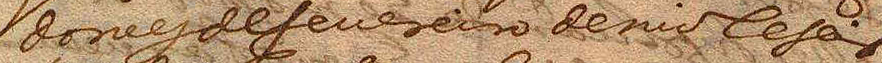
do mes de feuereiro de mil e seis
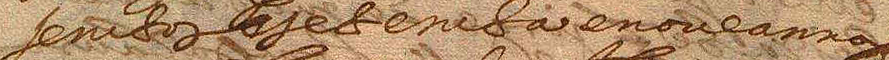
semtos e setemta e noue annos
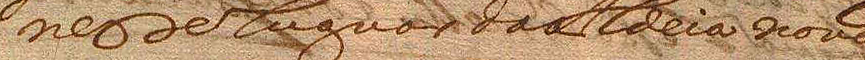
neste Luguar da Aldeia noua
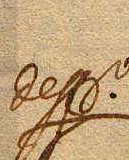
desp.o
